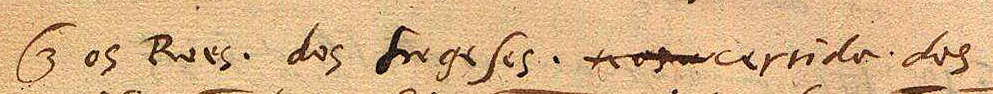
item os Roes. dos fregeses. e _ certida das
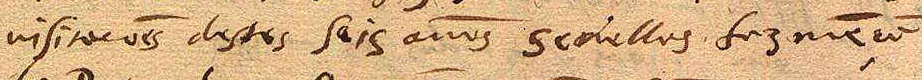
uisitacões destes seis an̄os se nelles fez mēçā
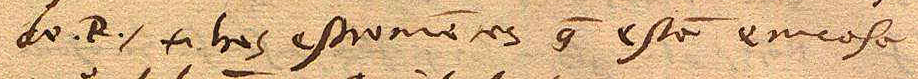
do .R./ e hos estromētos q̄ estā em casa
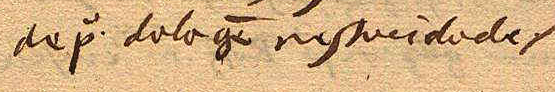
de po. da lagē nesta cidade /
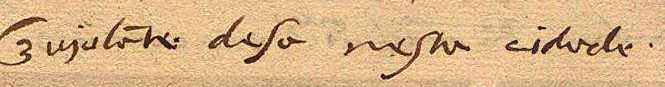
item ujolāte de sa nesta cidade.
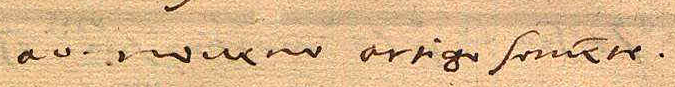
ao. noueno artigo somēte.
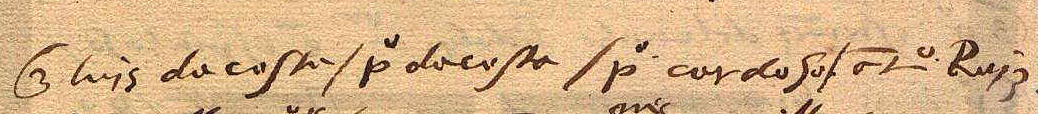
item lujs da costa / po da costa / po. cardoso / ālo. Rujz.
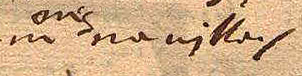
mores na uilla /
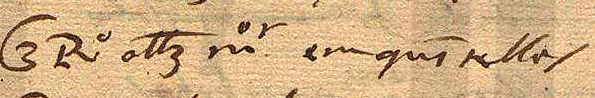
item Ro al̄lz mor. em quītella /
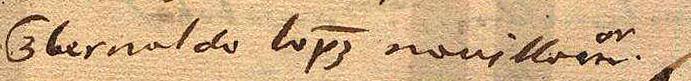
item bernaldo lop̄z na uilla e mor.
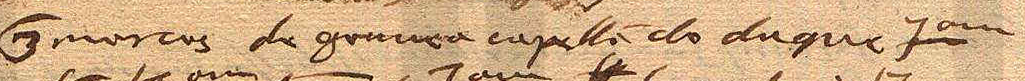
item marcos de gouuea capellā do duque Iam
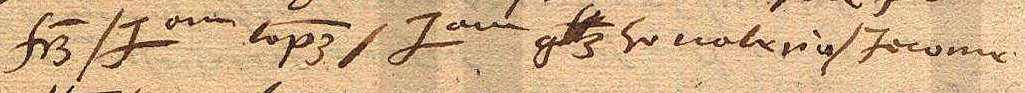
fr̄z / Iam lop̄z / Iam gl̄lz ho ualerio / Iacome
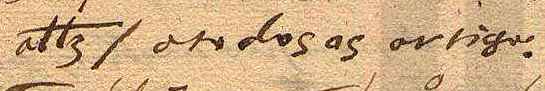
al̄lz / a todos os artigos.
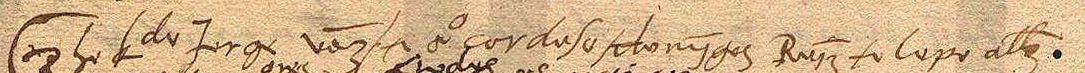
item ho Ldo Jorge vāz / e ao cardoso / e domj̄gos Rūiz e lopo al̄lz
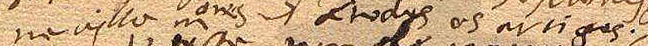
na ujlla mores a todos os artigos.
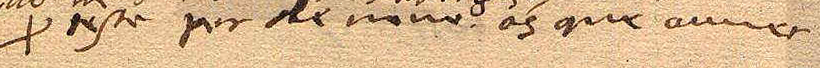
ꝓtesta por de nouo as que ouuer
